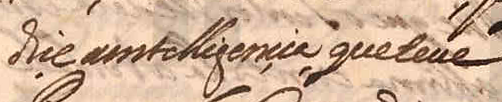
dice a intelligencia, que teue
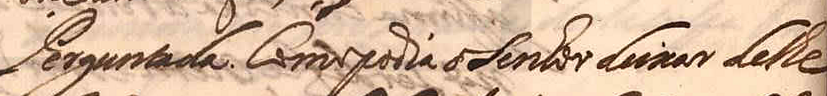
Perguntada Como podia o Senhor deixar de lhe
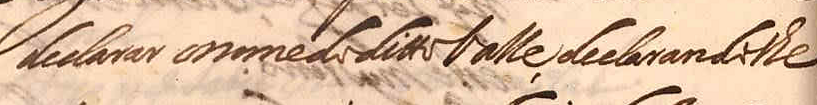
declarar o nome do ditto Vale, declarandolhe
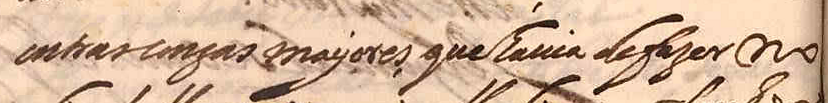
outras couzas mayores, que hauia de fazer no
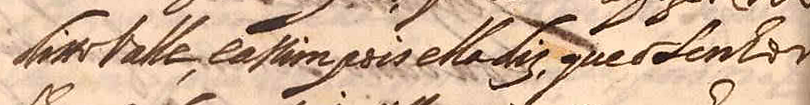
ditto Valle, e assim pois ella diz, que o Senhor
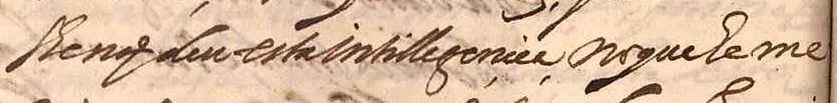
lhe naõ deu esta intelligencia, no que he me
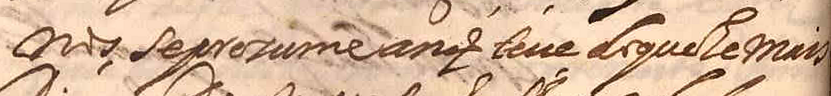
nos, se prezume a naõ teue, do que he mais
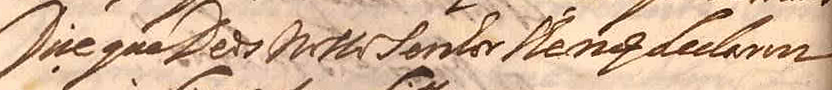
Dice que Deos nosso Senhor lhe não declarou
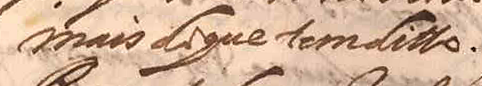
mais do que tem ditto.
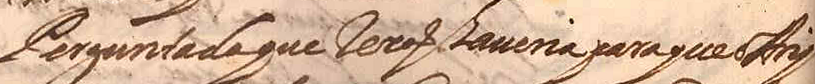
Perguntada que Rezaõ haueria para que o Anj
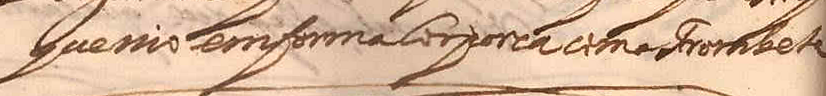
que uio em forma Corporea com a Trombeta
